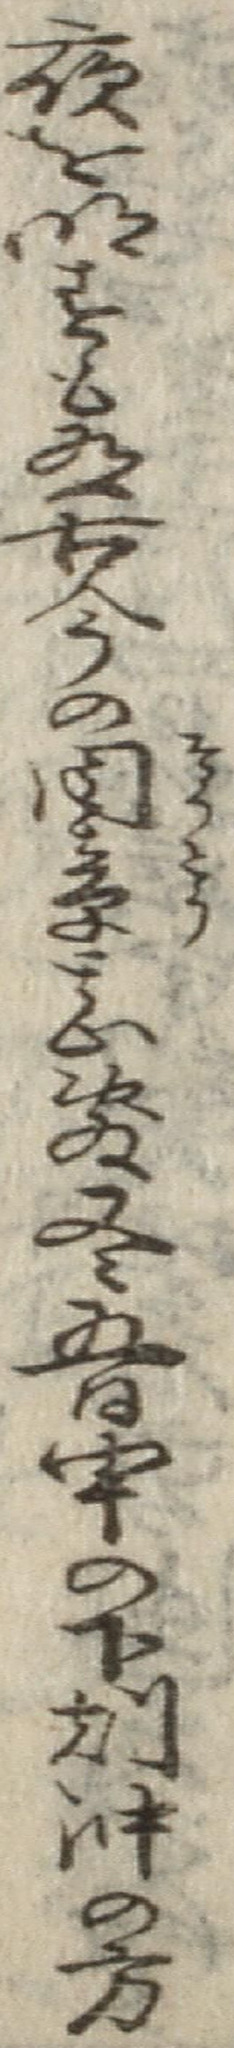夜を明すも有古今の周章甚敷又〻五日申の下刻沖の方
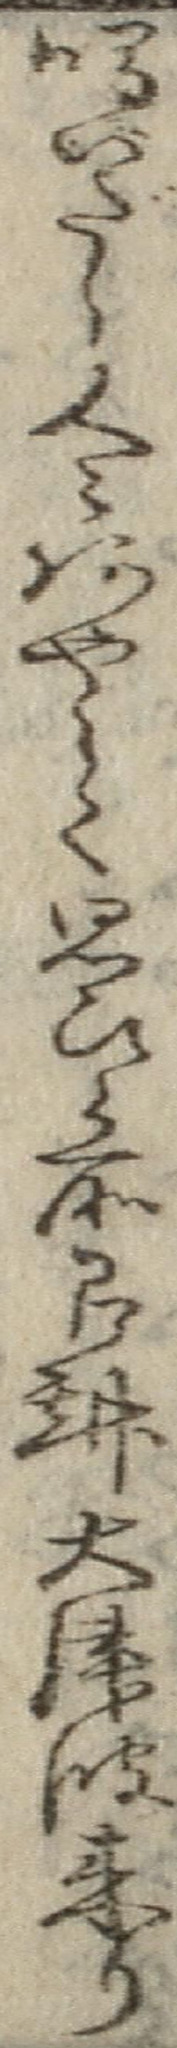鳴いだし人〻あやしく思ひ候処即刻大津浪来り
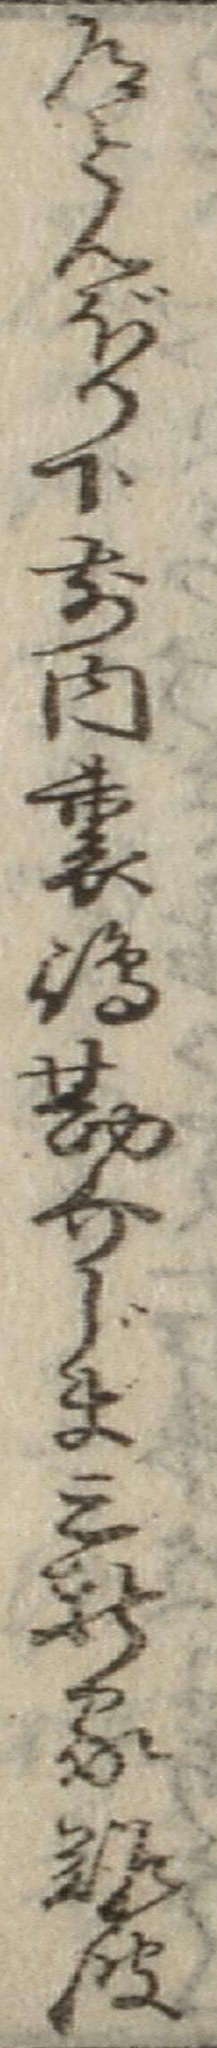道とんぼり下前内裏嶋勘介じま三軒家難波
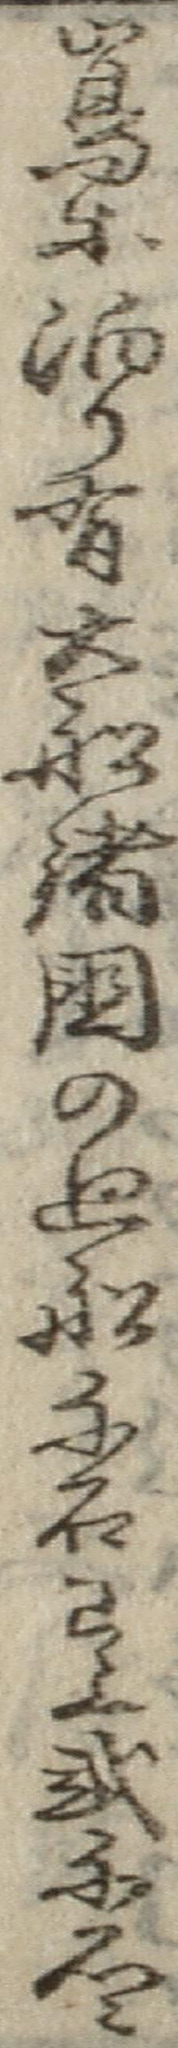嶌等泊り有大船諸国の廻船千石已上弐千石ニ
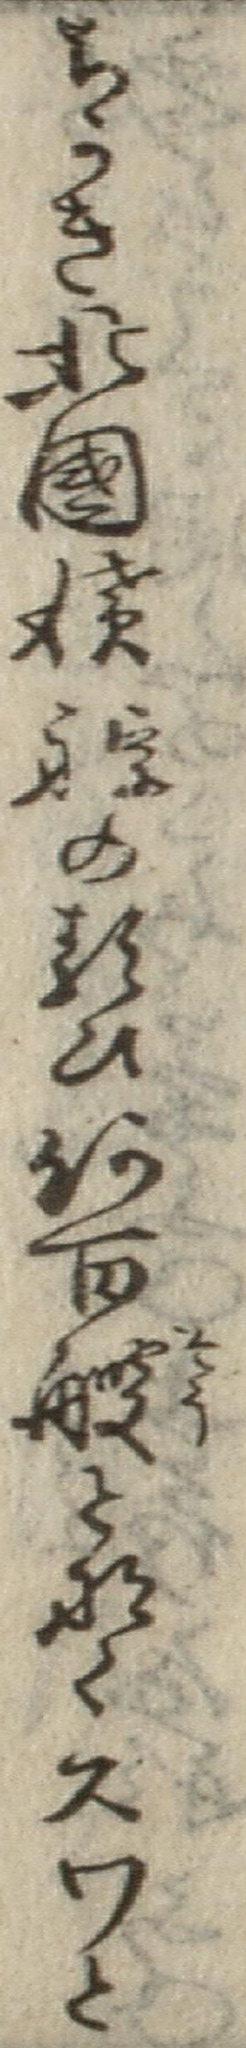ちかき北国積艀の類ひ何百艘となくスワと
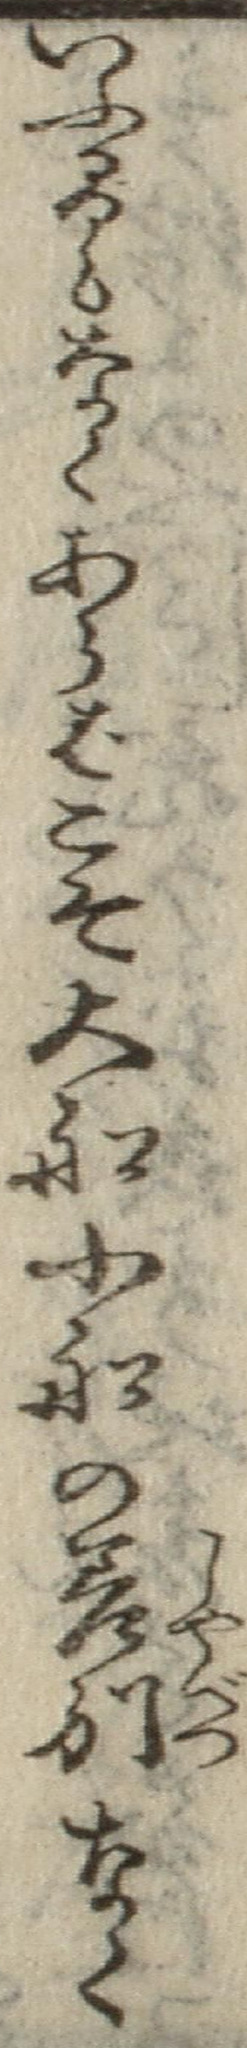いふ間もなくあらばこそ大船小船の差別なく
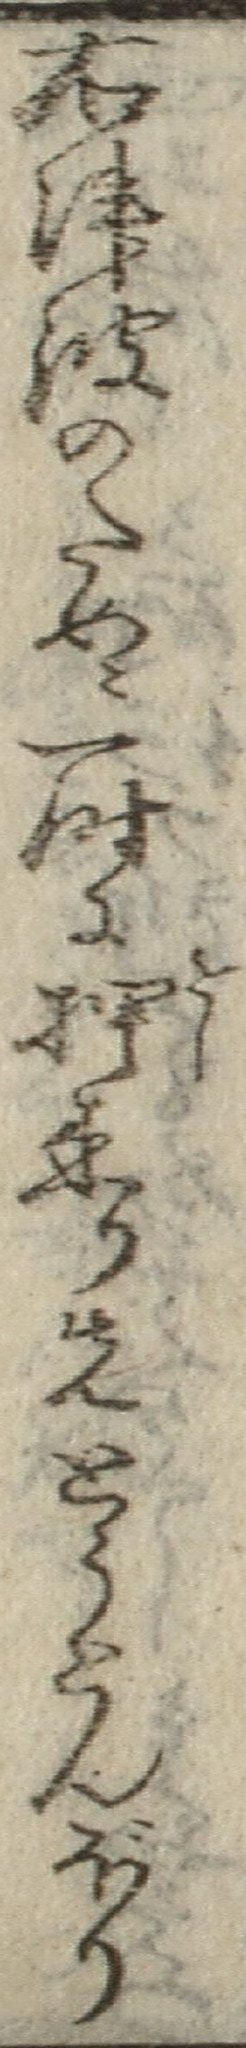右津波のためニ一時に押来り先とうとんぼり
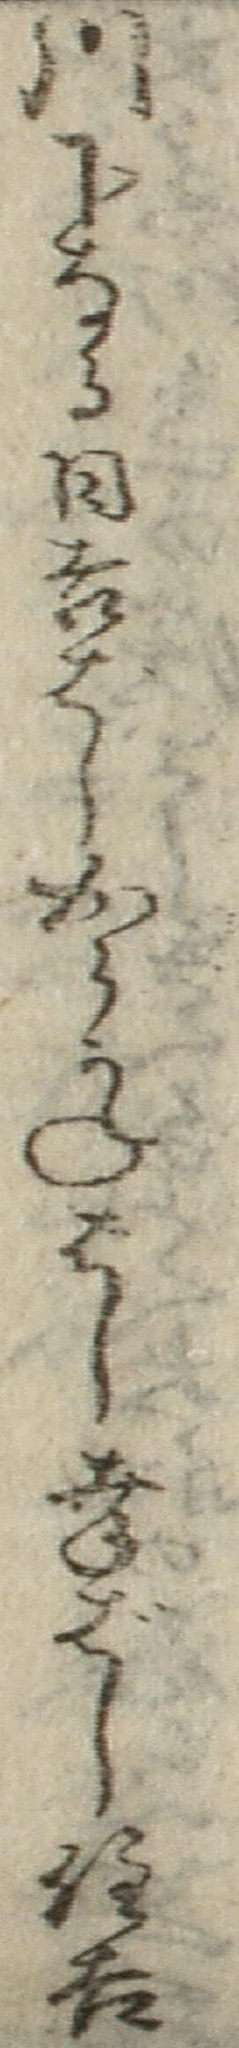川下なる日吉はしからかねばし幸ばし住吉
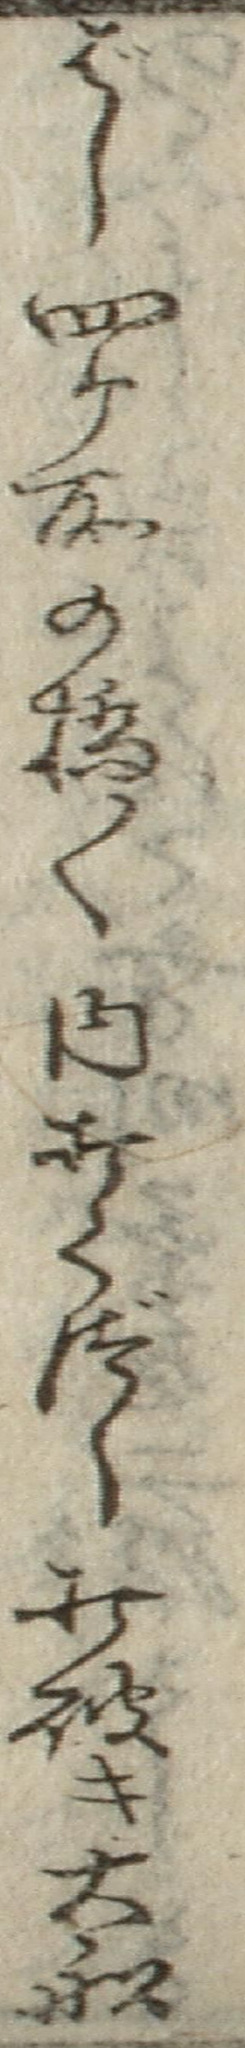ばし四ケ所の橋〳〵内打くづし打破キ大船

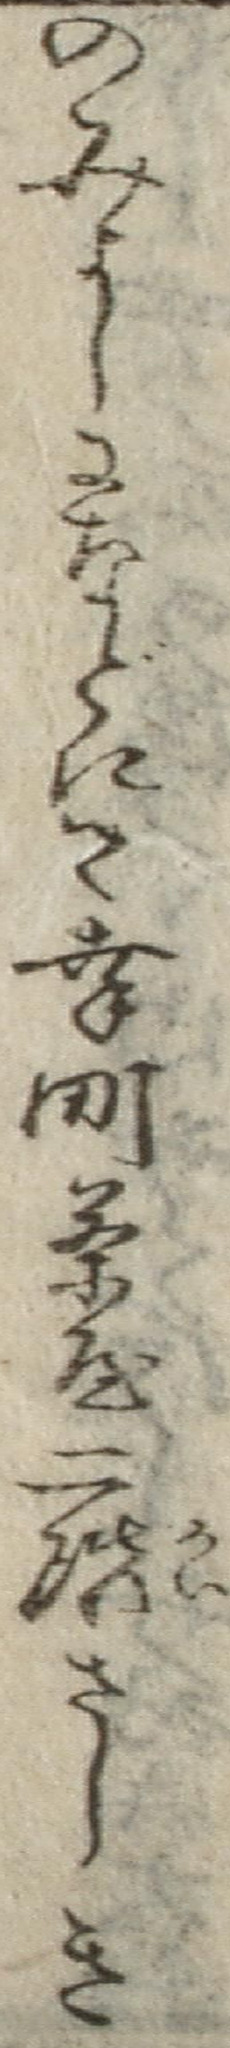のみよしになどにて幸町茶屋二階さしき
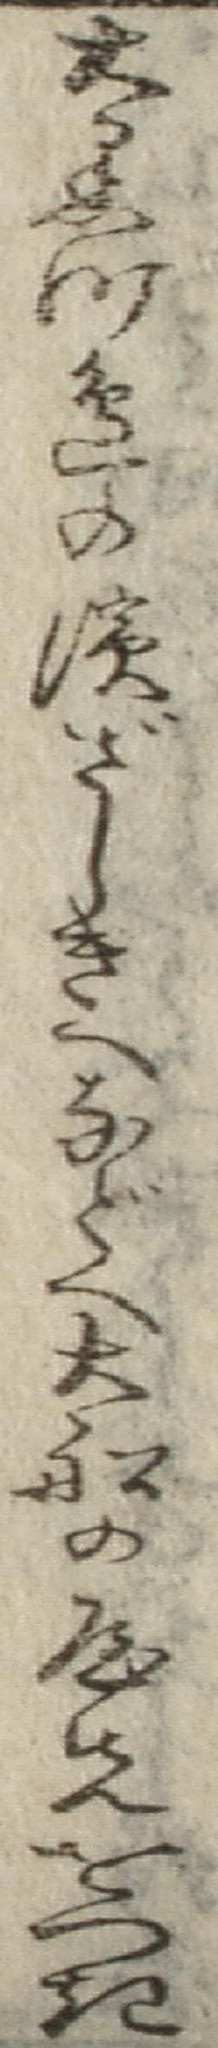大黒町辺の濱ざしきへなどへ大船の屋先をつき
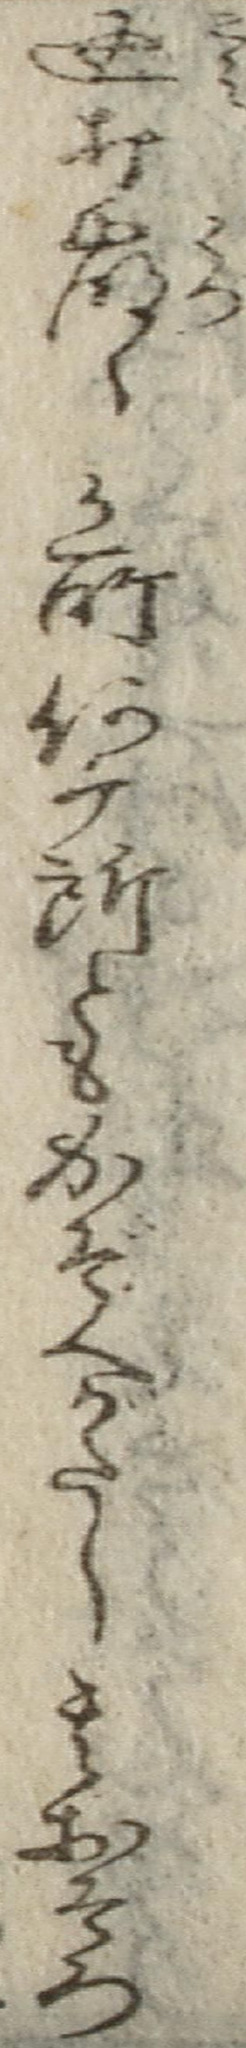込打崩しか所何ケ所ともかぞへかたし其おそろしさ
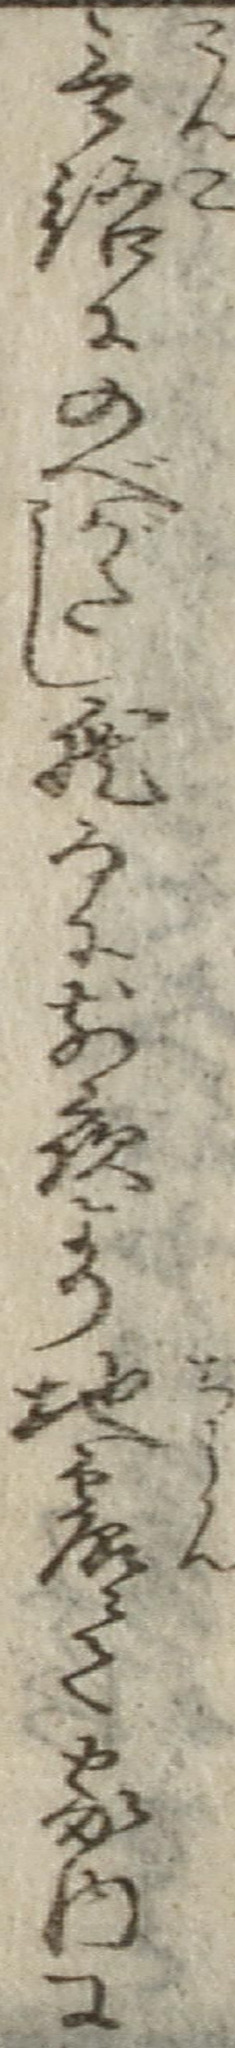言語にのべがたし然るに前夜より地震にて家内に
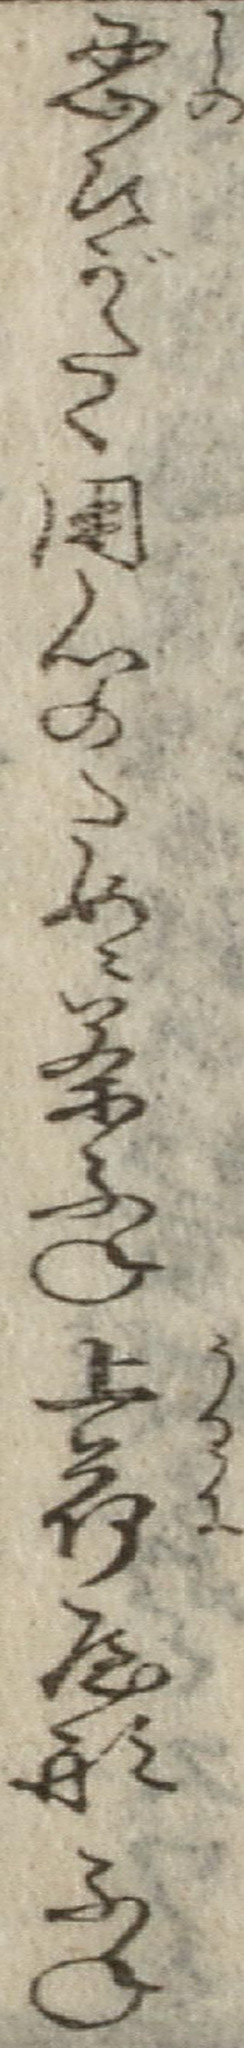忍ひがたく用心のために茶ふね上荷屋形ふね
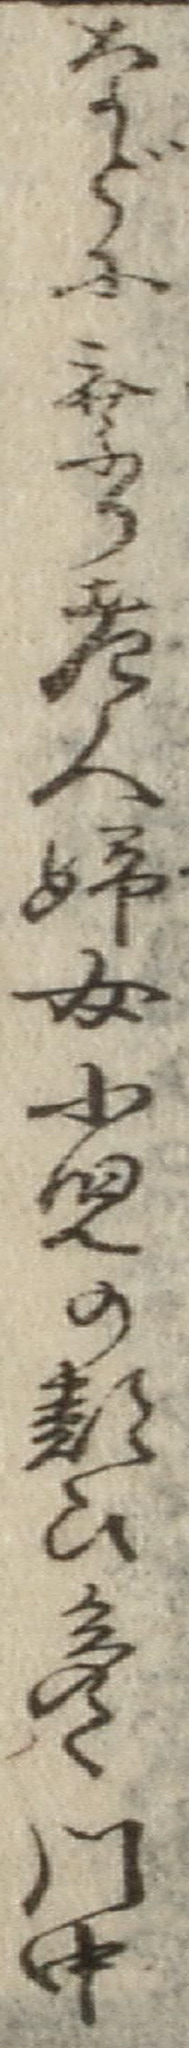などに乗り老人婦女小児の類ひ多く川中
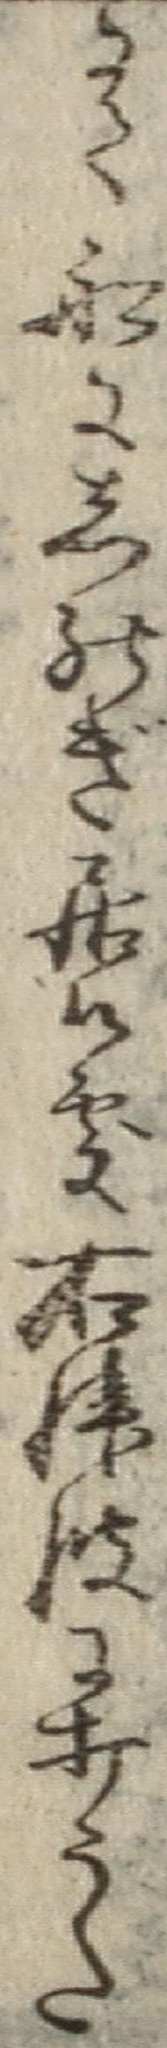にて船にしのぎ居候処右津波に打うた
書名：世直り艸紙
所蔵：東京大学地震研究所図書室 Earthquake Research Institute Library, The University of Tokyo, JAPAN
